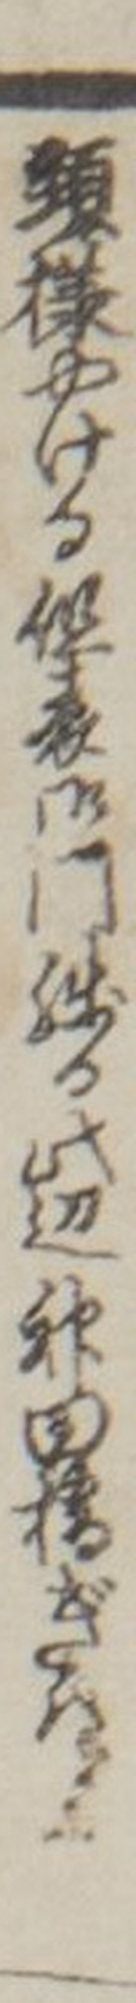頭様やける但表御門残る此辺神田橋ぎは
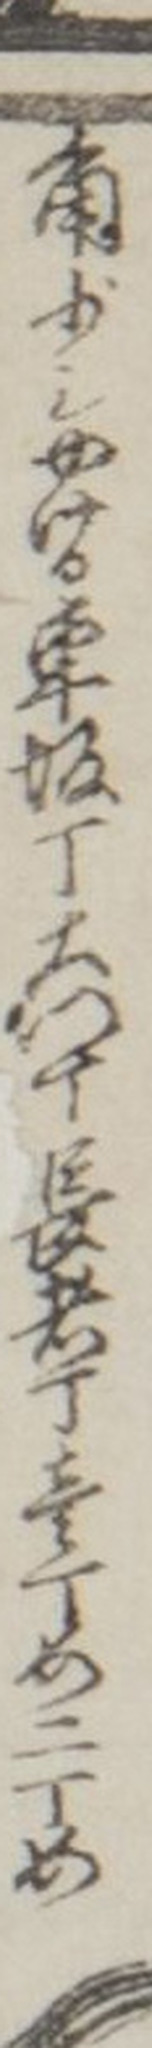角少し焼ける車坂丁大門丁長者丁壱丁め二丁め
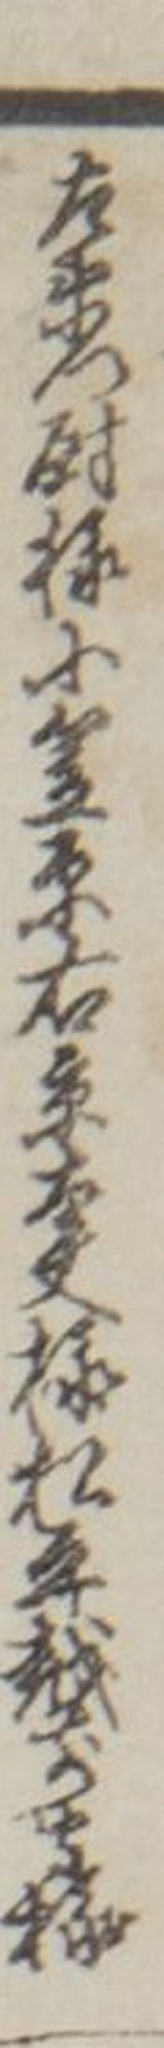左衛門尉小笠原右京太夫様松平越前守
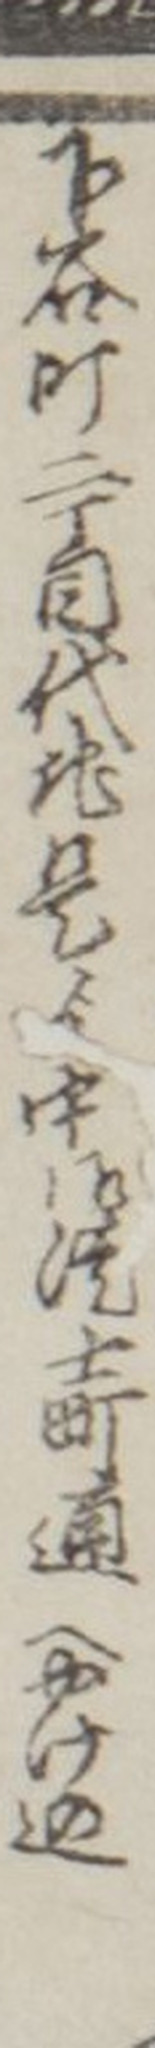下谷町二丁目代地是ゟ中御徒町通へやけの也
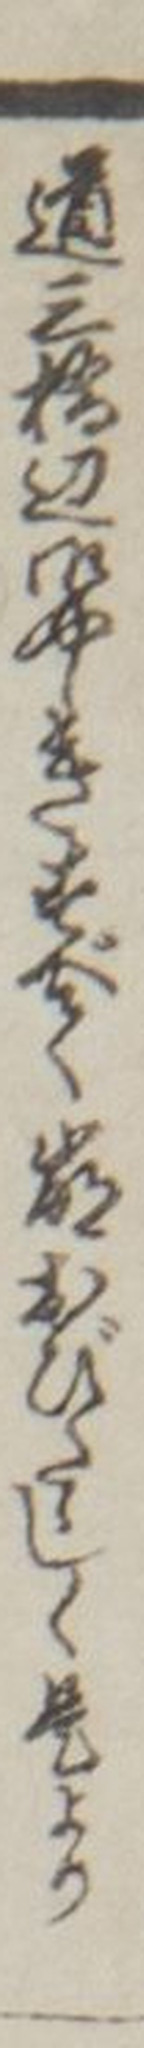道三橋辺御やきすべて崩おびたゝしく是より
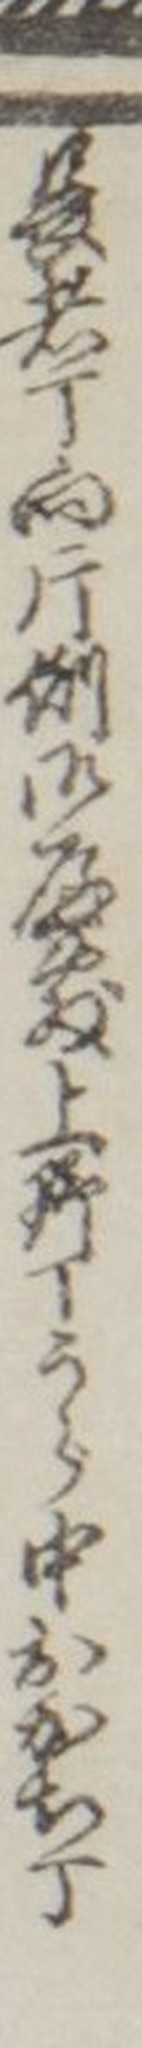長者丁向片側御屋敷上野丁うら中おかち丁
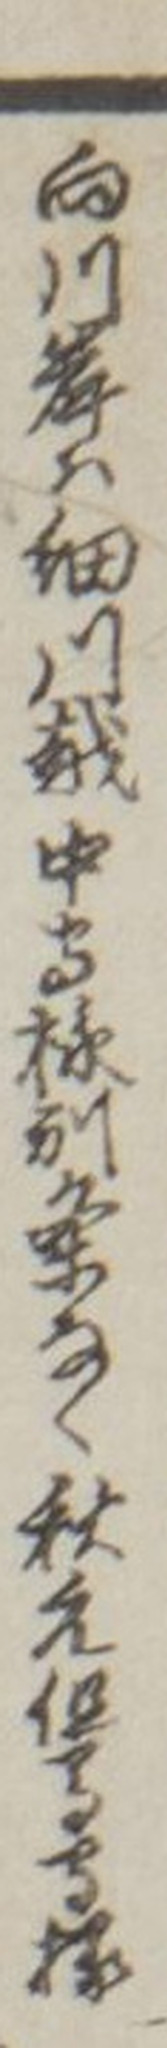向川岸は細川越中守様別条なく秋元但馬守様
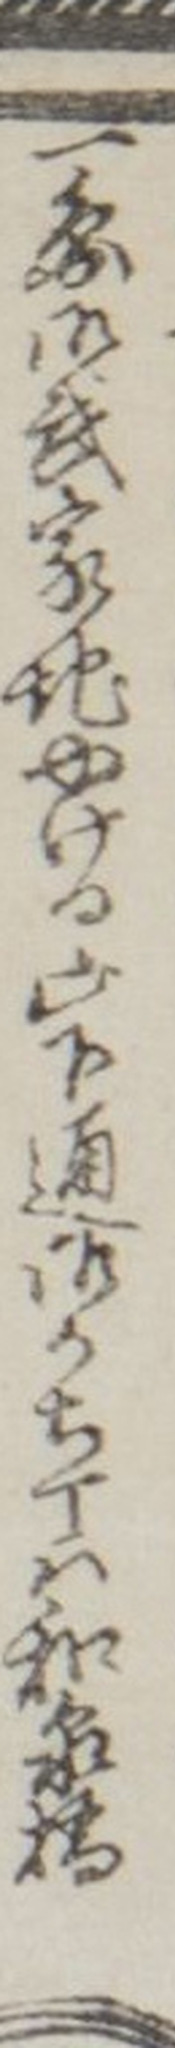一円御武家地やける山下通御かち丁は和泉橋
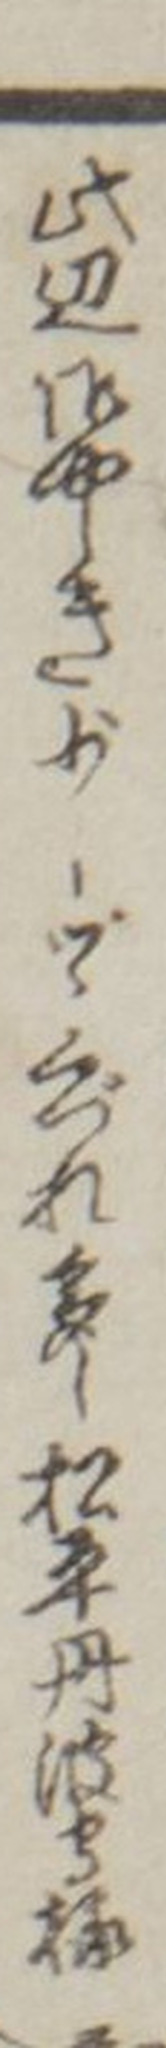此辺御やしき少しツヽくづれ多し松平丹波守様
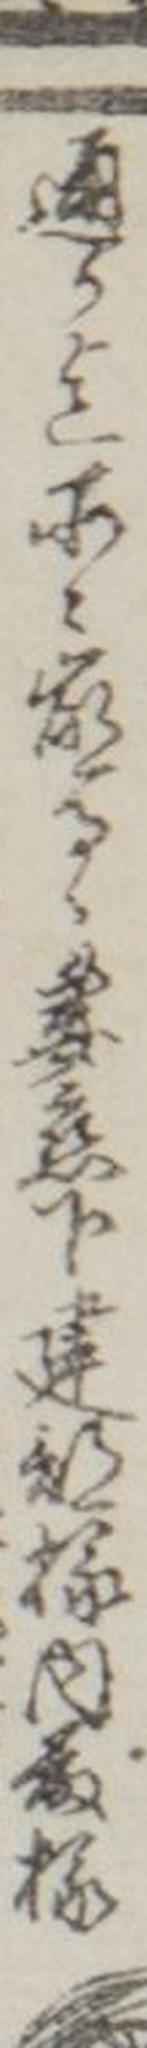通り迄所々崩るゝ妻恋下建部様内藤様
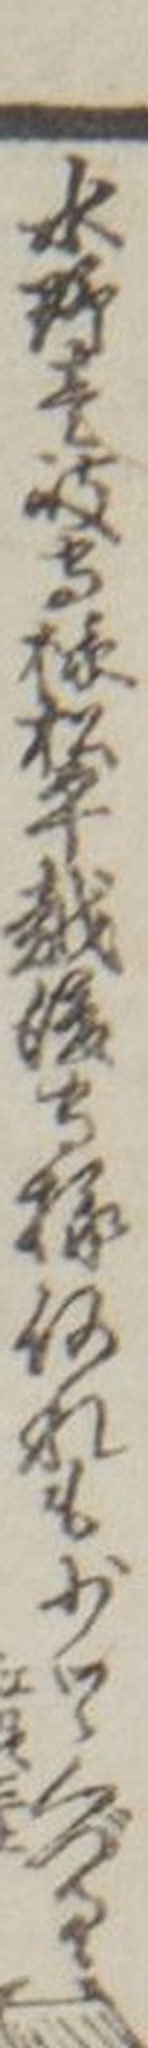水野壱岐守様松平越後守様何れも少ツヽくづるゝ
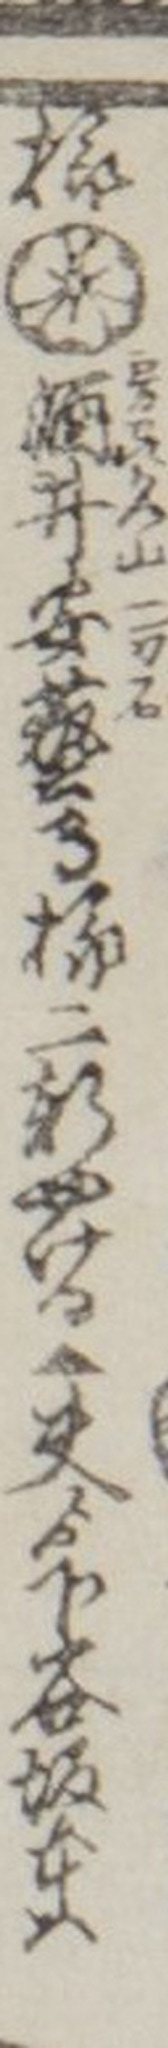様「家紋」酒井安芸守様二軒焼ける▲夫ゟ下谷坂本は
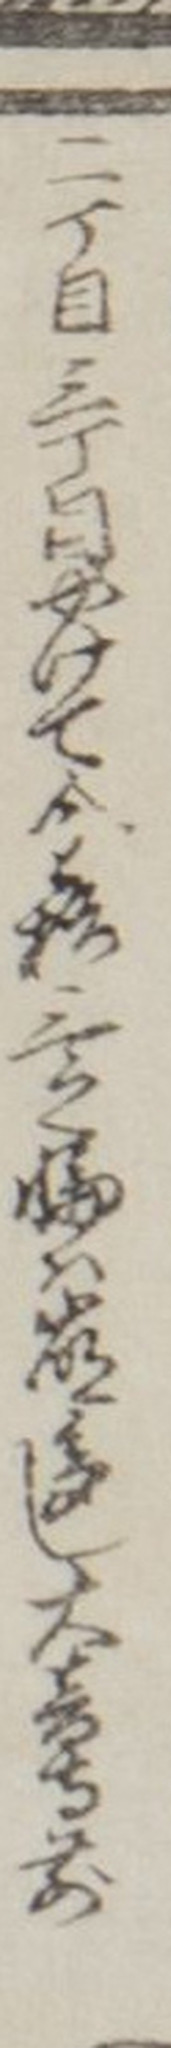二丁目三丁目やけて金杉三之輪は崩多し大音寺前
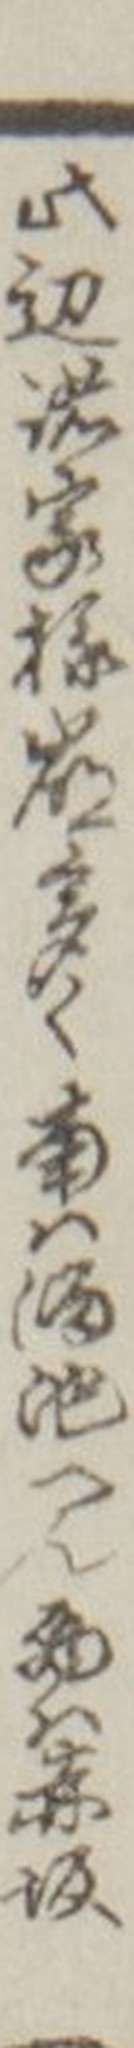此辺諸家様崩多く南は溜池へん西は赤坂
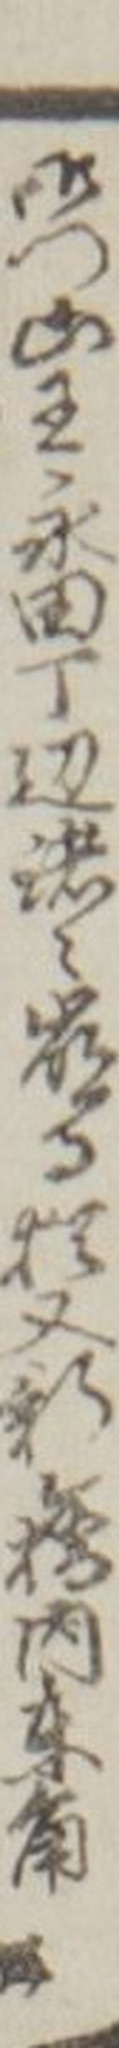御門山王永田丁辺諸々崩る猶又新橋内東角
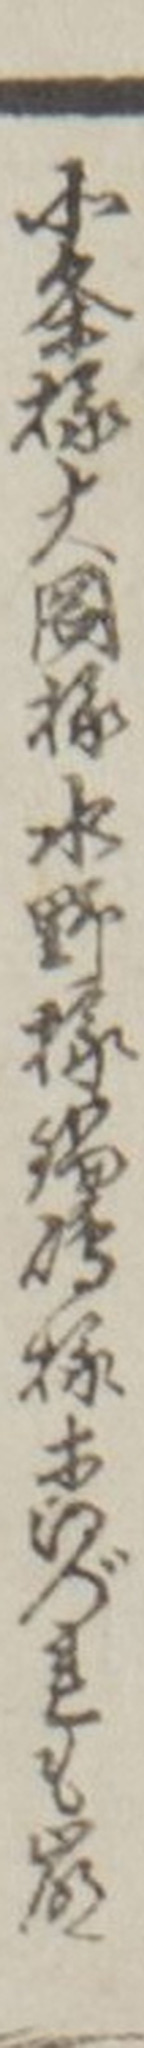北条様大岡様水野様鍋島様等いづれも崩
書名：大地震記事
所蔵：あいおいニッセイ同和損保株式会社
